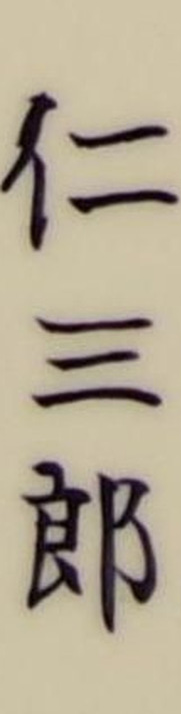仁三郎
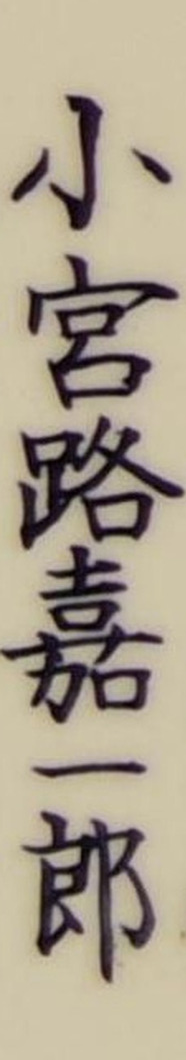小宮路嘉一郎
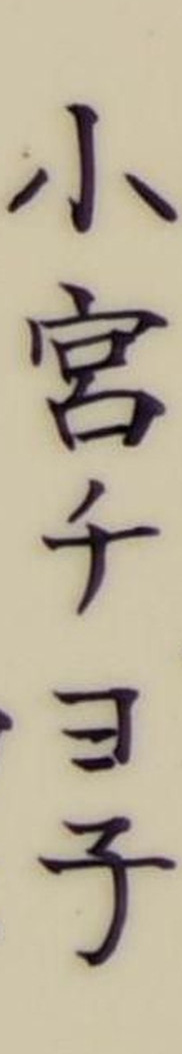小宮チヨ子

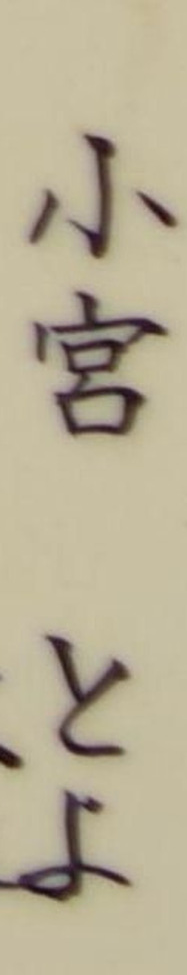小宮とよ
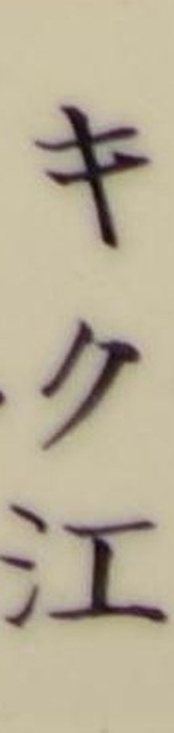キク江
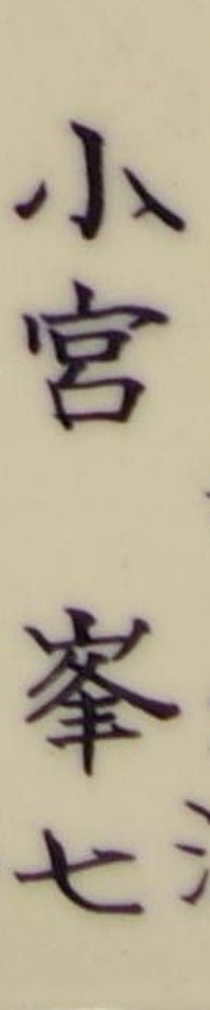小宮峯七
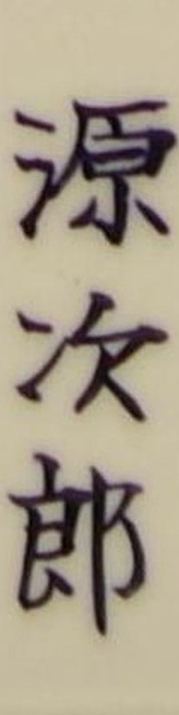源次郎
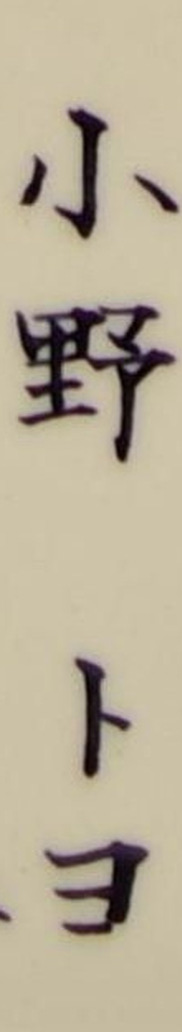小野トヨ
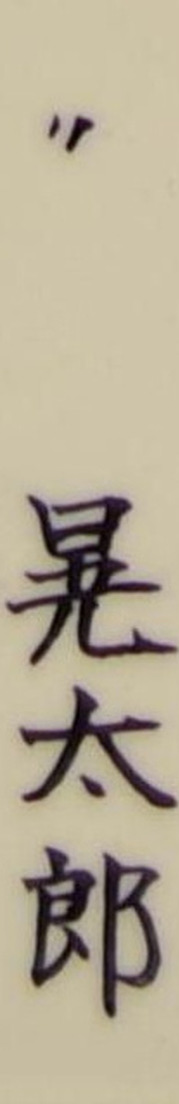晃太郎
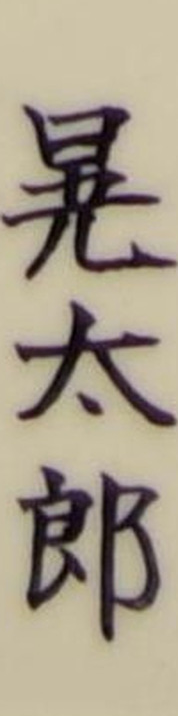晃太郎
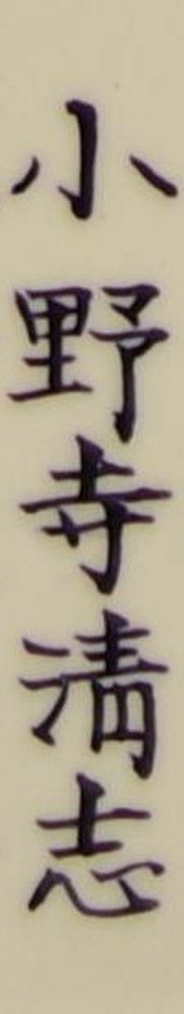小野寺清志
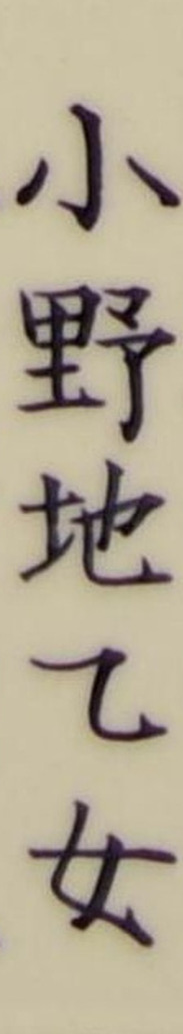小野地乙女
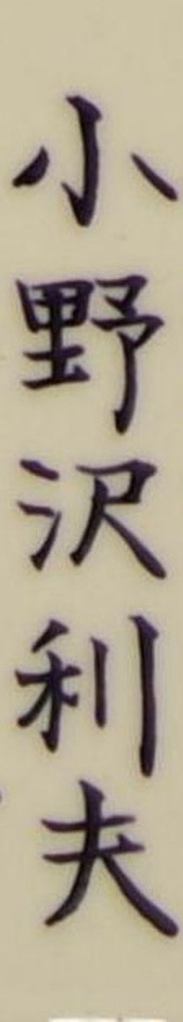小野沢利夫
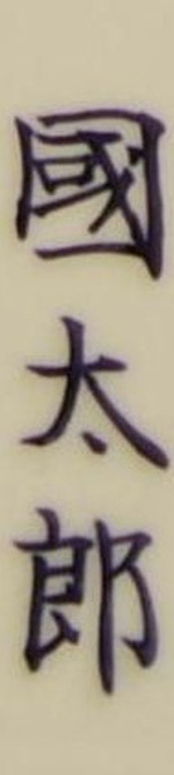晃太郎
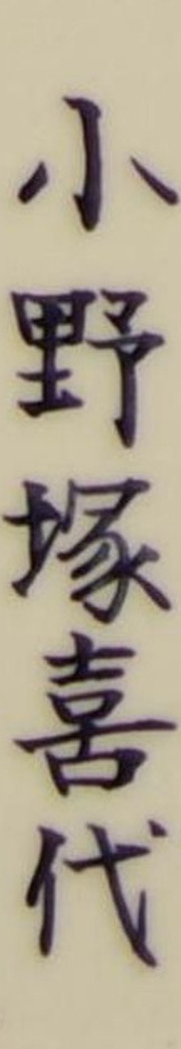小野塚喜代
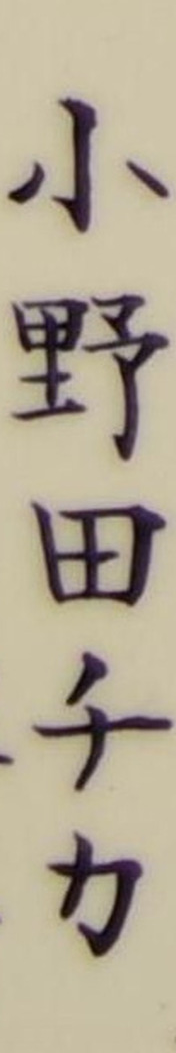小野田チカ
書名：E~L
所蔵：高野山金剛峯寺
